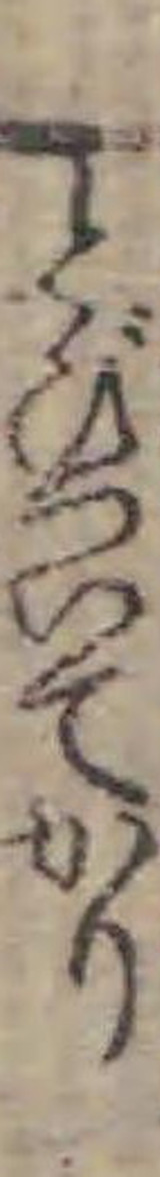とびついてかり
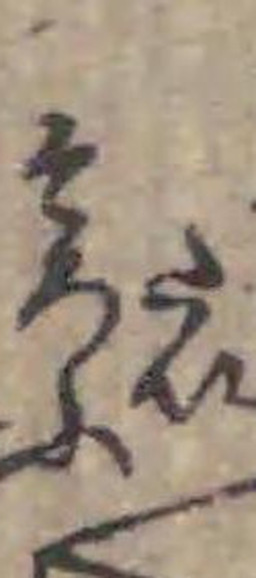そろふ
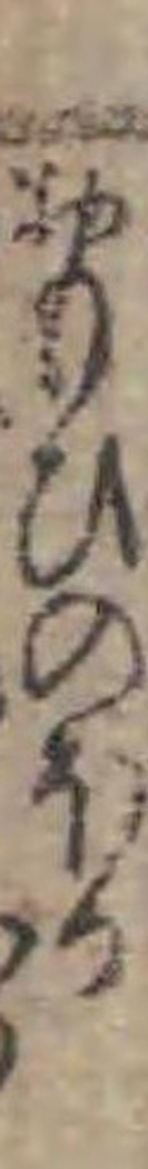おもひのほか
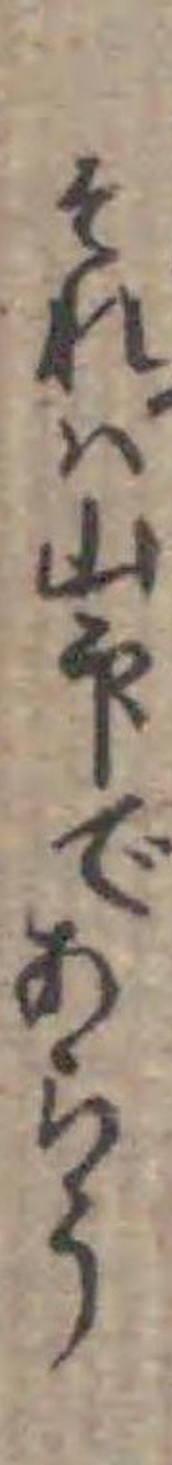それは山印であらう
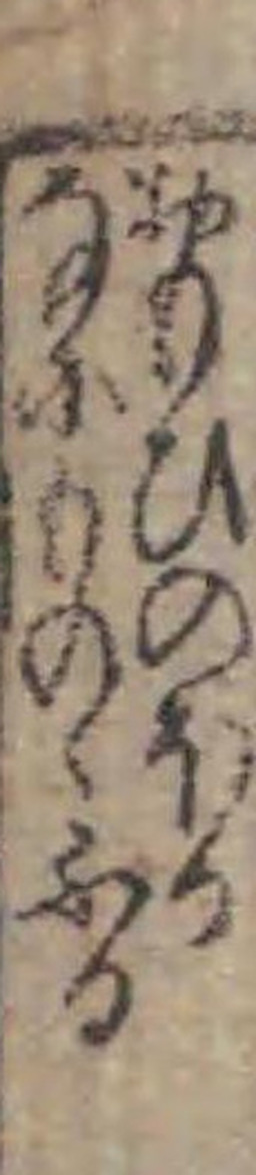なにものゝふる
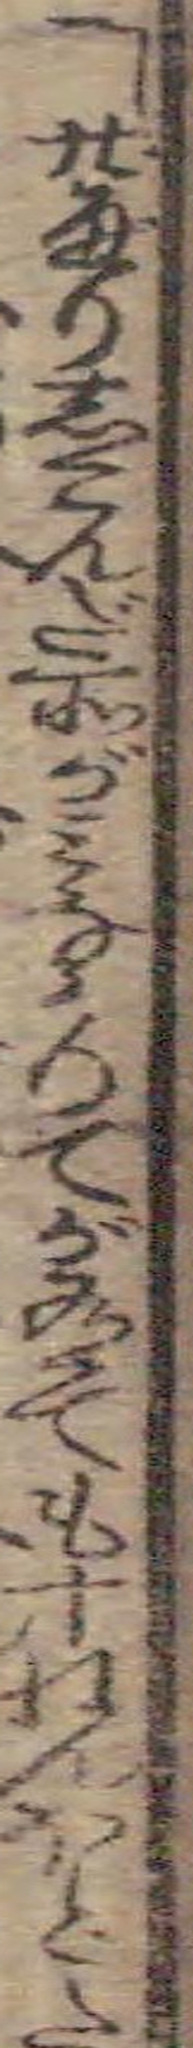〽廿通りしこんだ所がみなうりてが有ても十ねんほどたゝねは
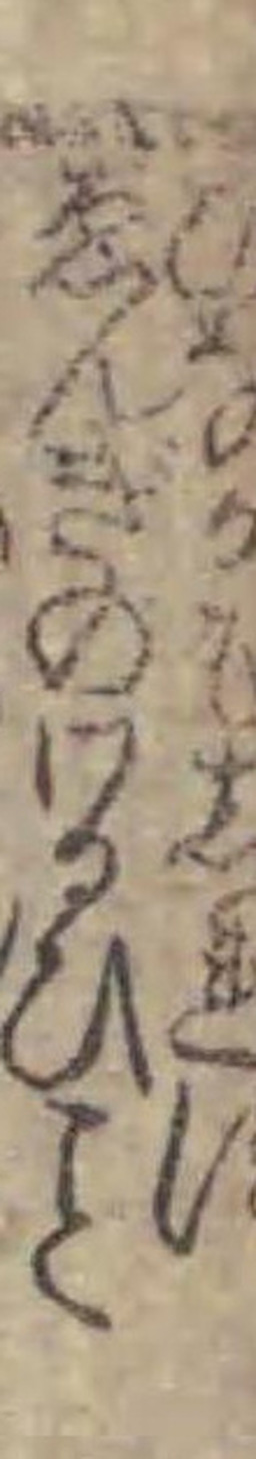ゑんぎのわるひこと
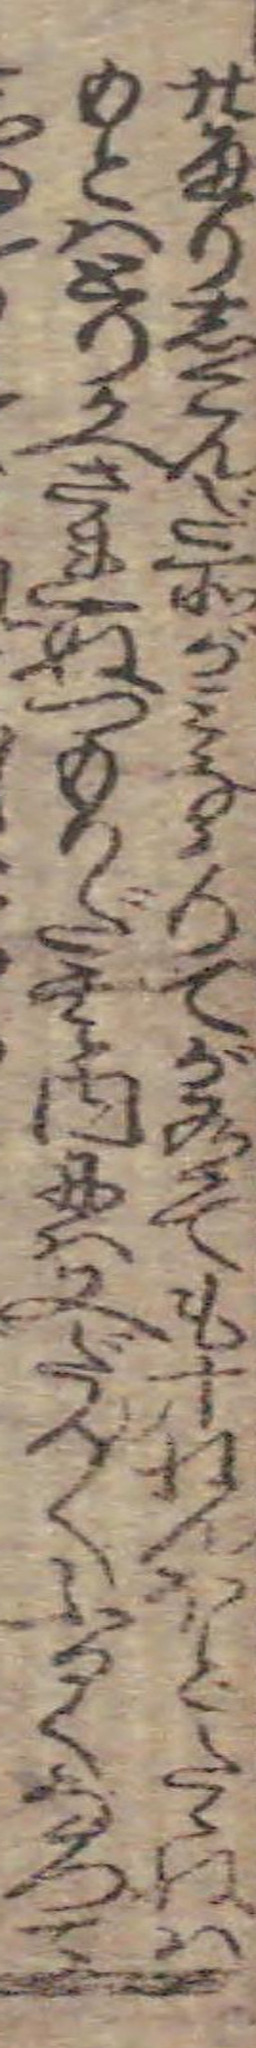もとはとりかへされぬつもりだ其内には又だん〳〵ふるくなつて
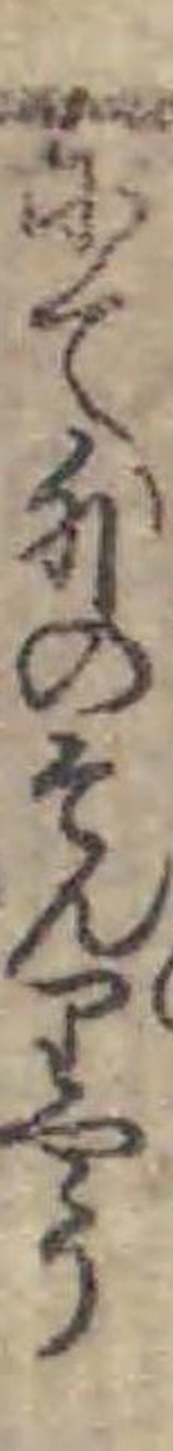にて外のそんりやう
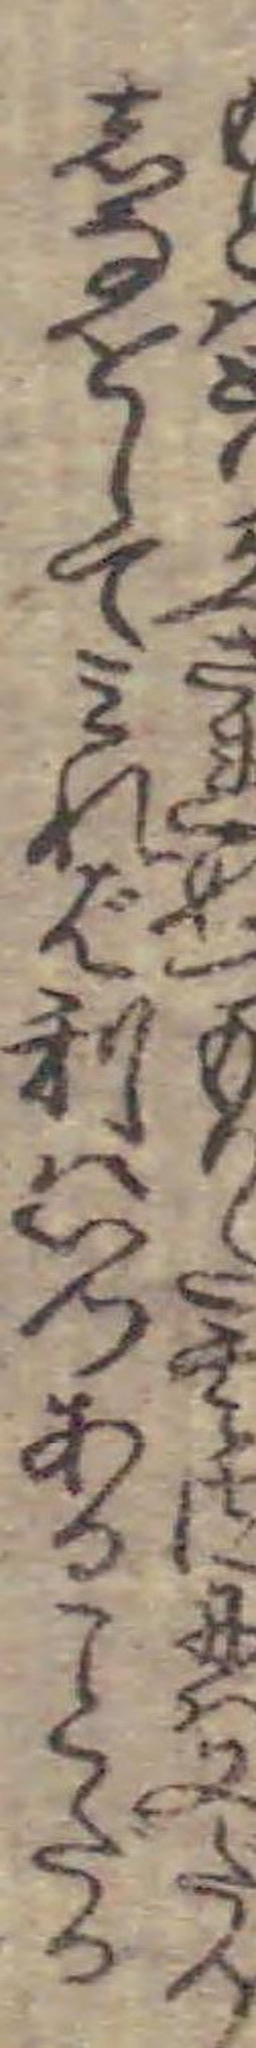しるをしてみれば利はいつあることだか
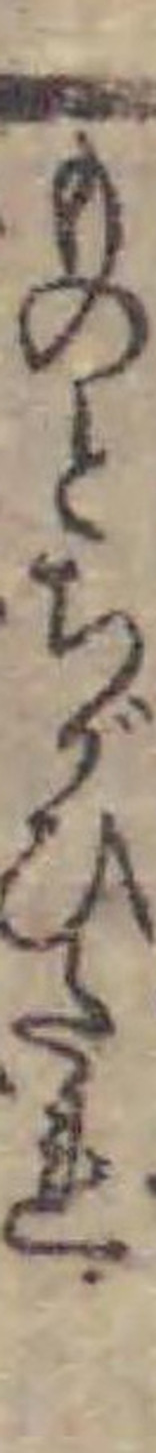ものとちがひたれ
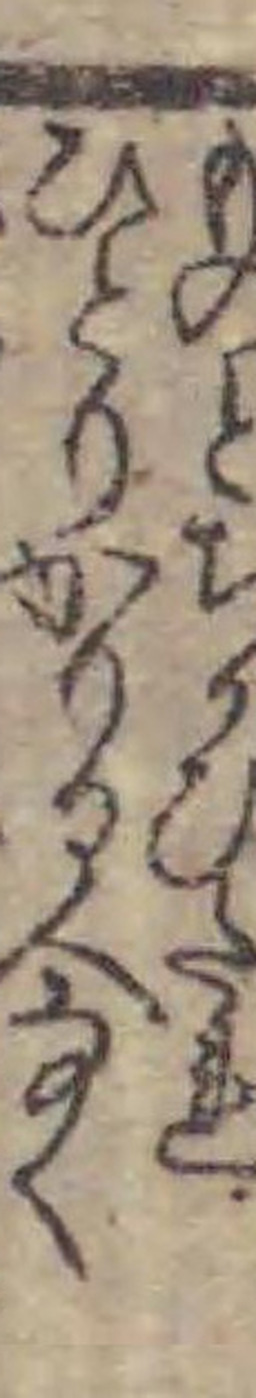ひとりかりる人なく
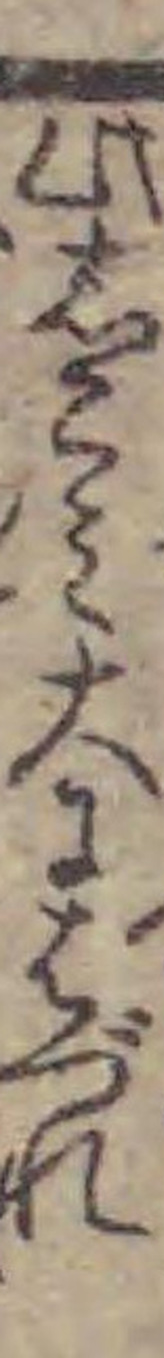此しこみ大にはづれ
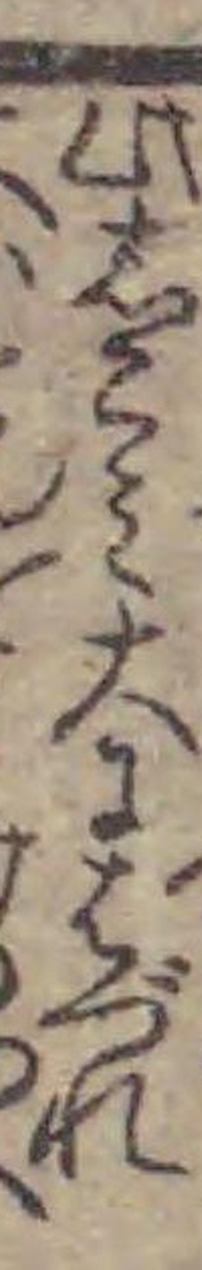此しこみ大にはづれ
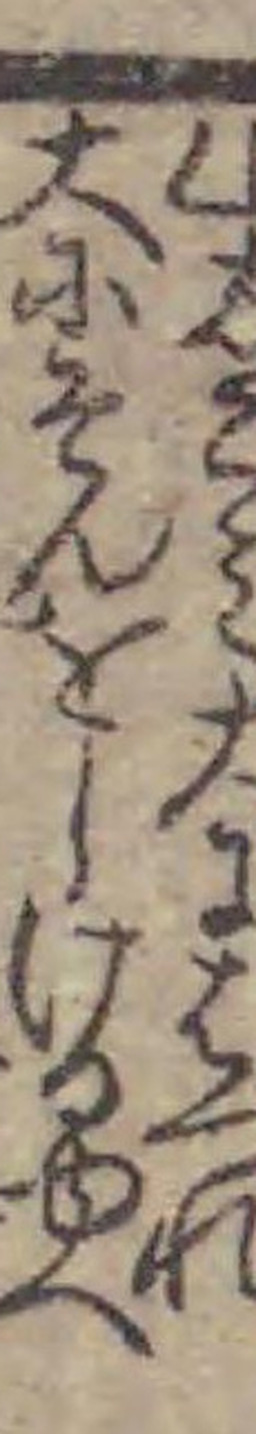大にそんをしけるゆへ
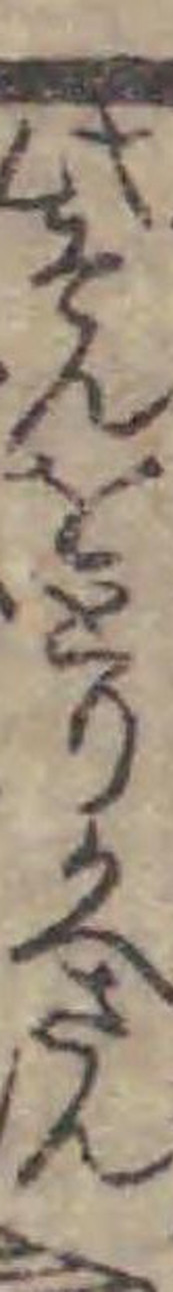此そんをとりかへさん
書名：本樹真猿浮気噺 : 3巻
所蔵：国立国会図書館 National Diet Library, JAPAN
